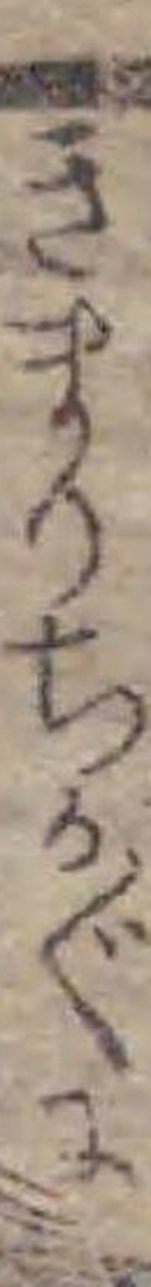きまりちか〴〵に
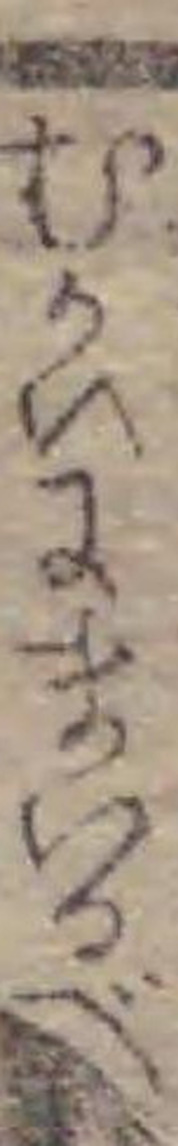むかいにまいるべ
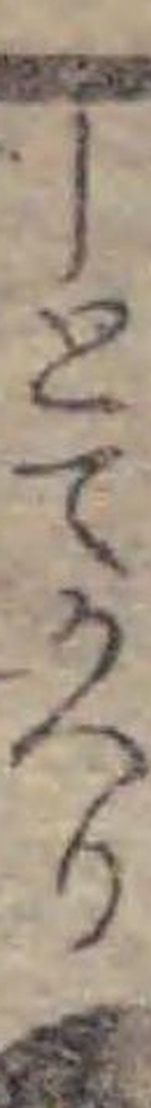しとてかへり
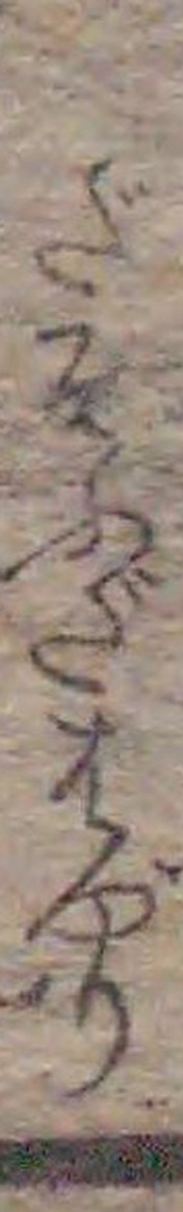だそふだはやり
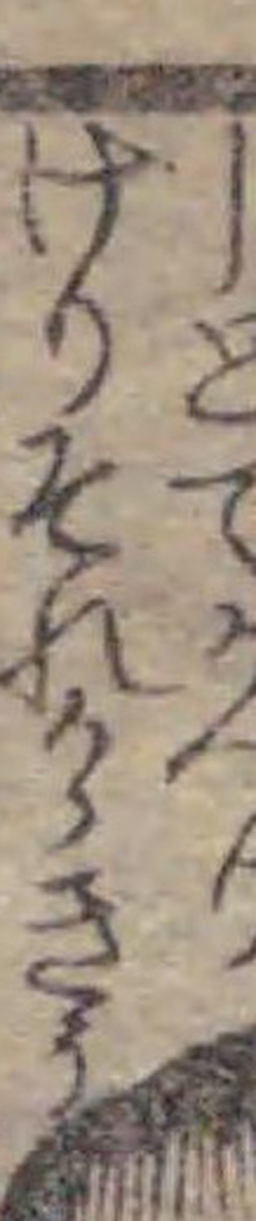けりそれからきう
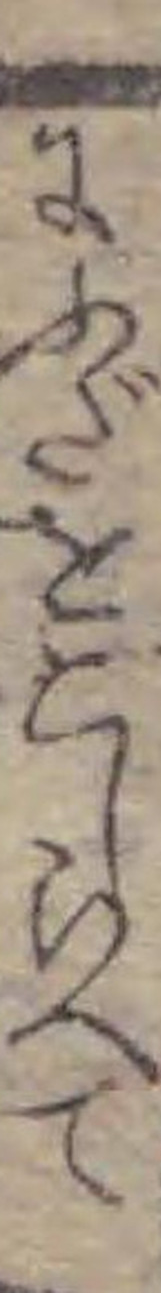にふだをこしらへて
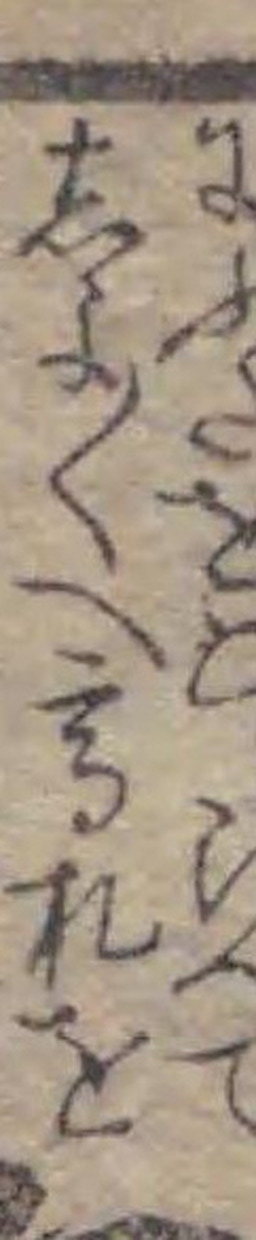しよ〳〵へ高札を
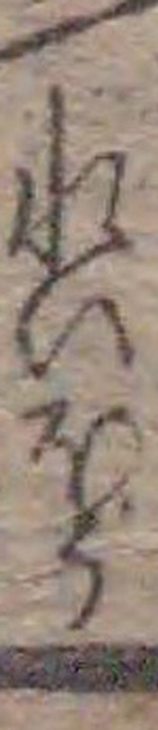れいほう
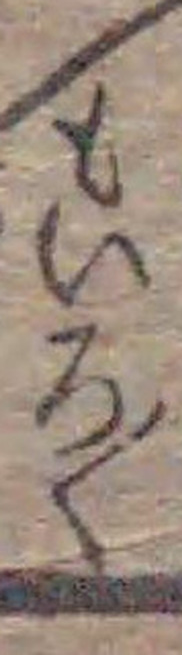もいろ〳〵
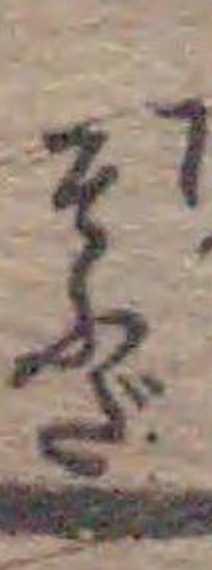そふだ
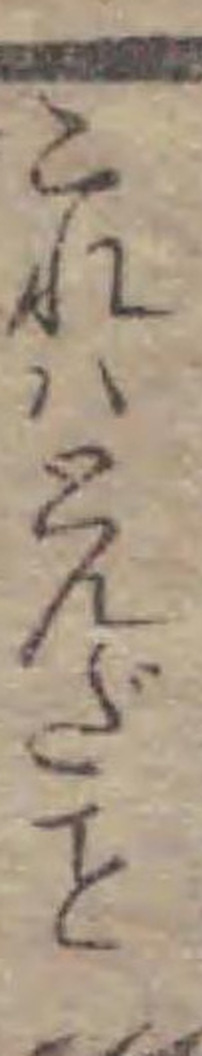これはとんだこと
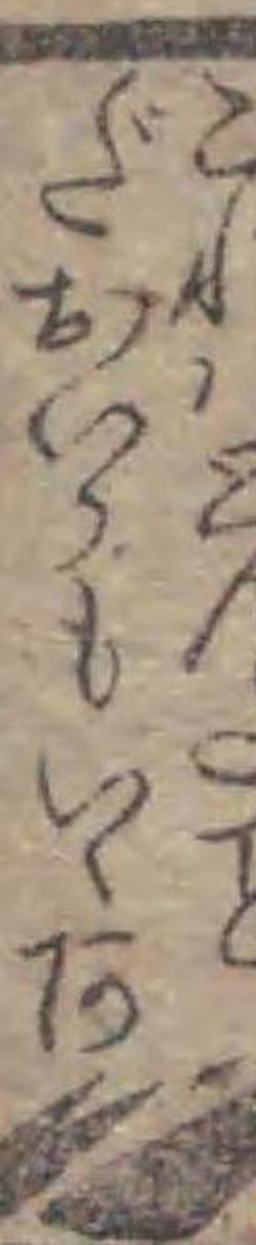だおいらもいゝあ
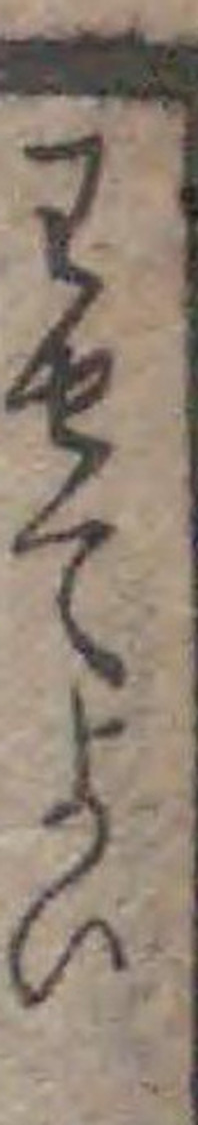わせてよい
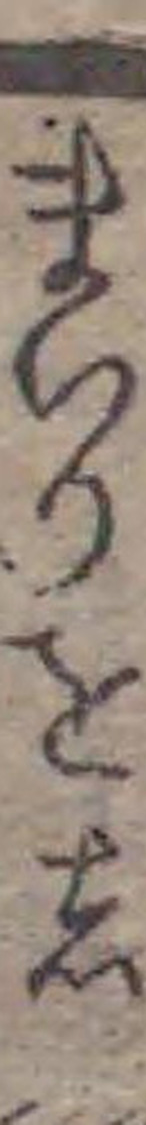まいりをし
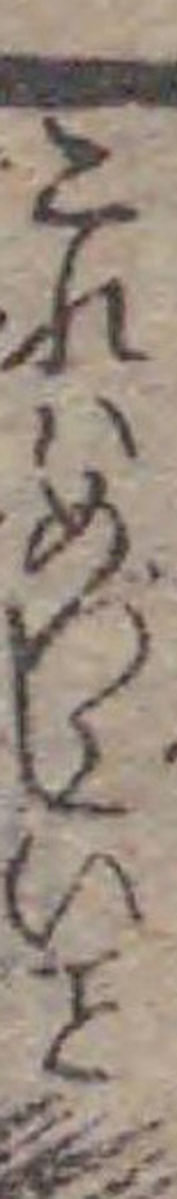これはめづらしいこと
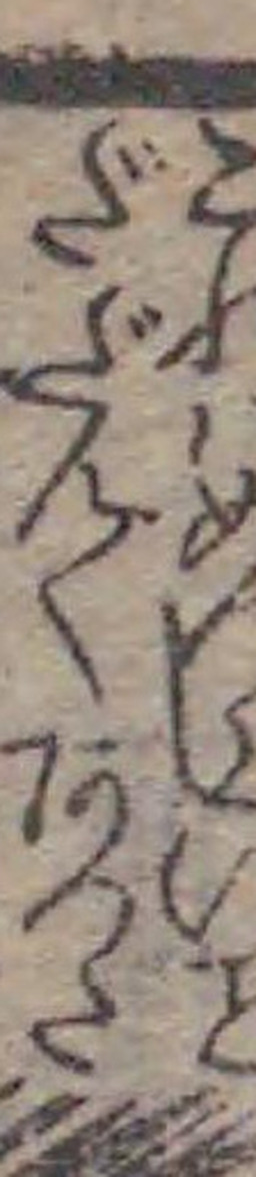だだん〳〵あつた
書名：化物七段目 : 2巻
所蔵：国立国会図書館 National Diet Library, JAPAN
